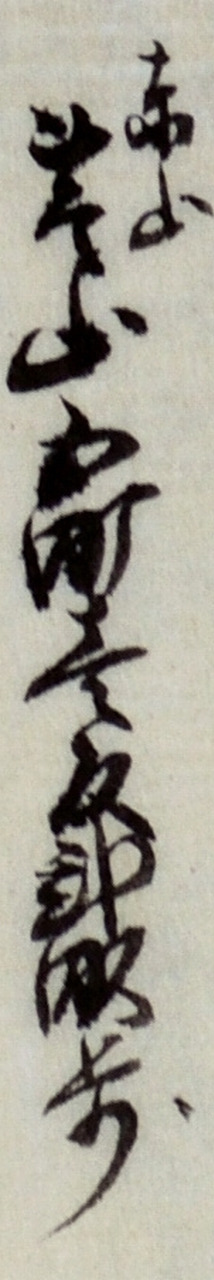芝山五町壱反弐畝歩同断
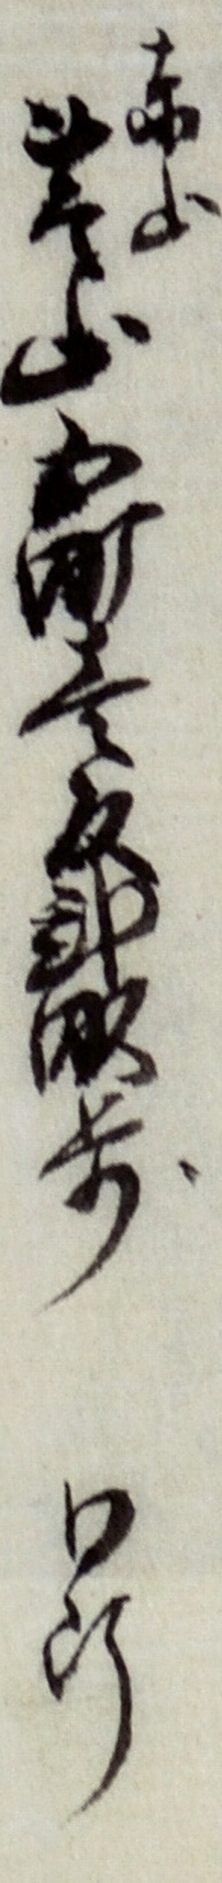芝山五町壱反弐畝歩同断
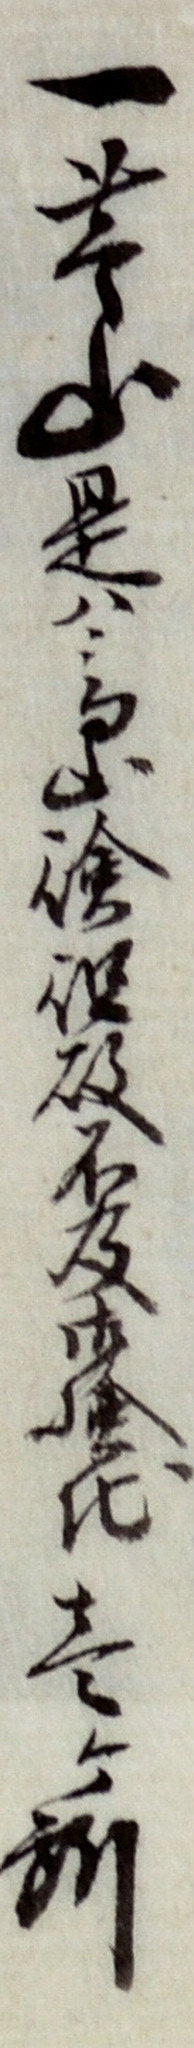一芝山是ハ高山嶮阻故不及御検地壱ヶ所
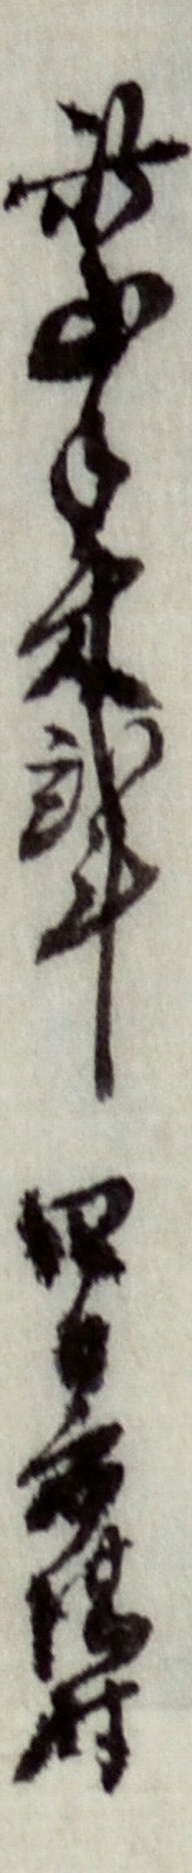此山手米弐斗四日市場村
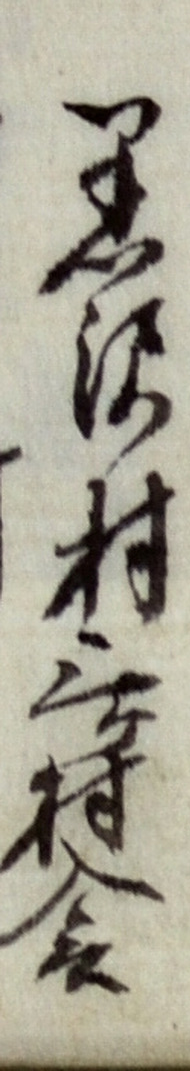黒沢村三ヶ村入会

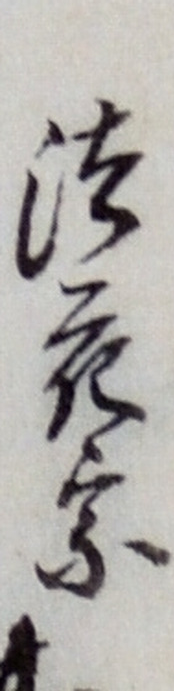法華宗
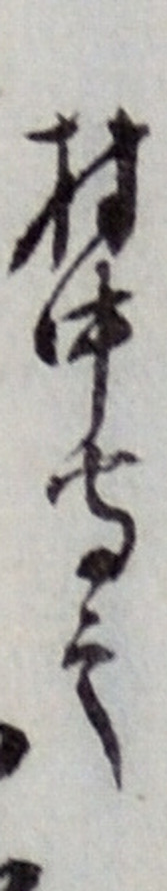村中守之
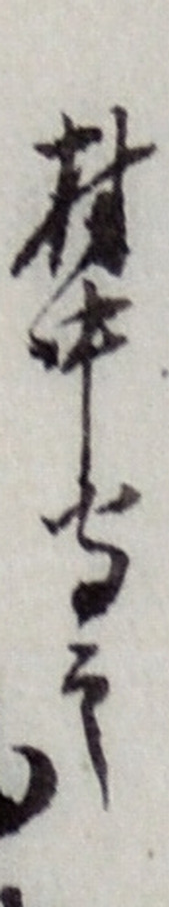村中守之
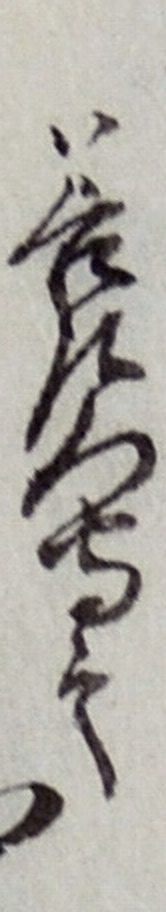善左衛門守之
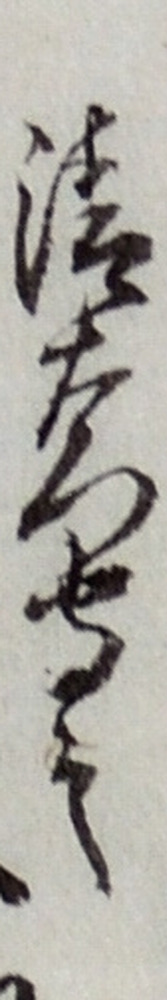清左衛門守之
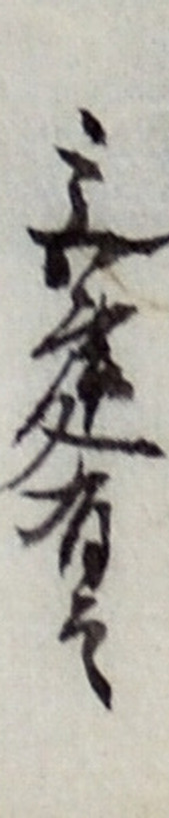宮建有之
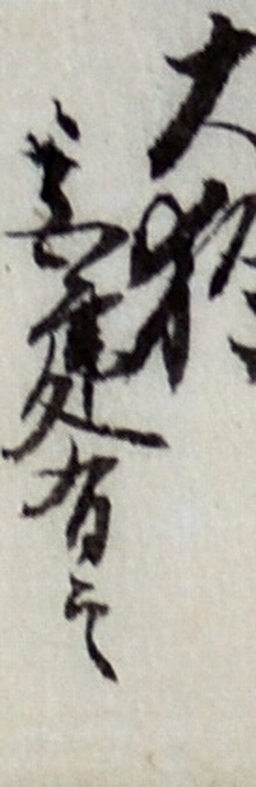宮建有之
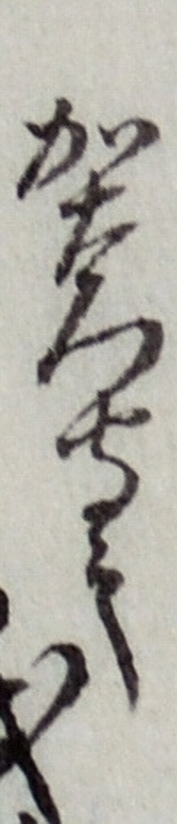加右衛門守之
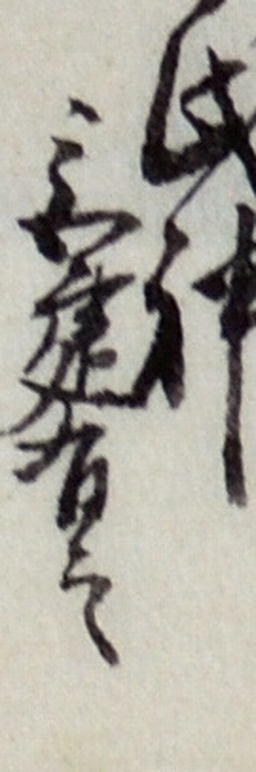宮建有之
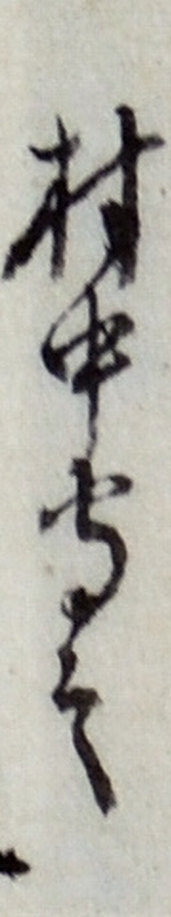村中守之
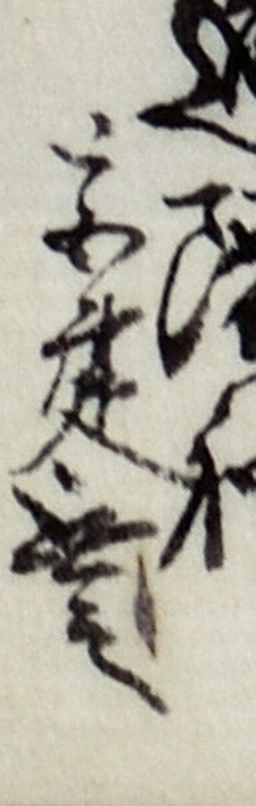宮建無之
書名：御領分中山林社地手控
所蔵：伊那市立高遠町図書館・合同会社AMANE
